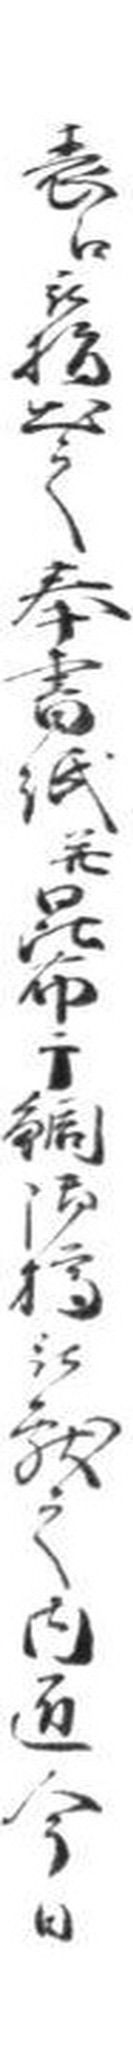表江被指出之奉書紙并昆布干鯛御樽被献之内匠今日
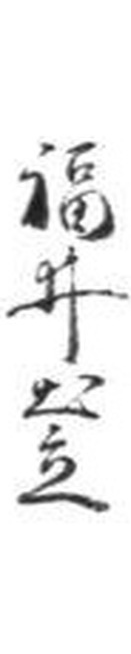福井出立
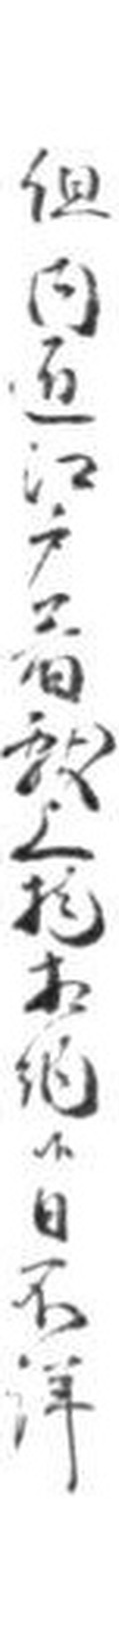但内匠江戸着献上物相納候日不詳
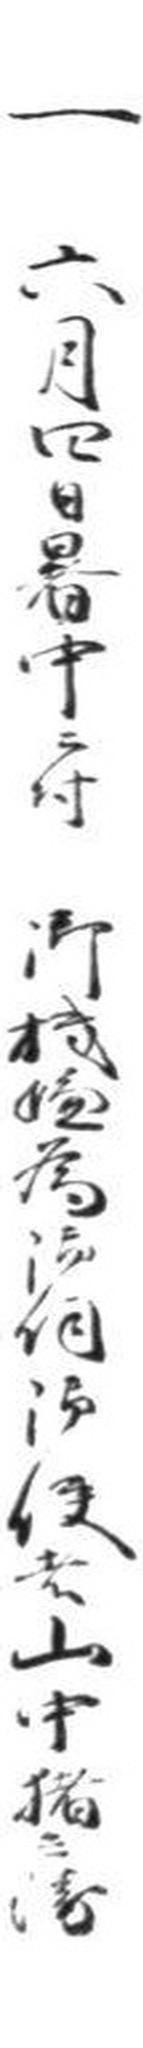一六月四日暑中ニ付御機嫌為御伺御使者山中猪兵衛
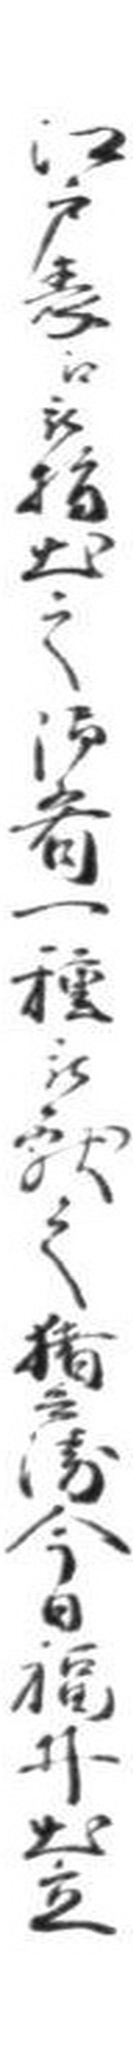江戸表江被指出之御肴一種被献之猪兵衛今日福井出立
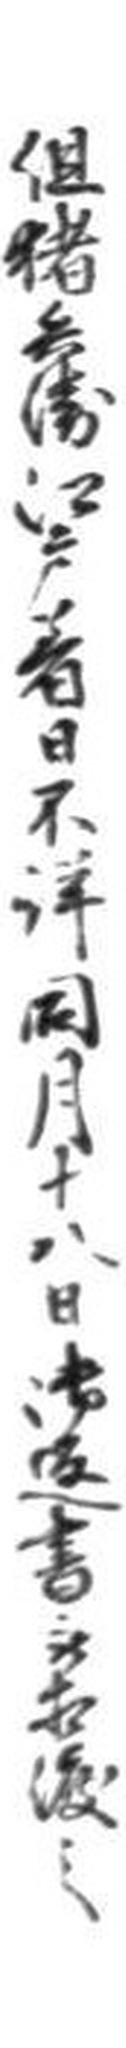但猪兵衛江戸着日不詳同月十八日御返書被相渡之
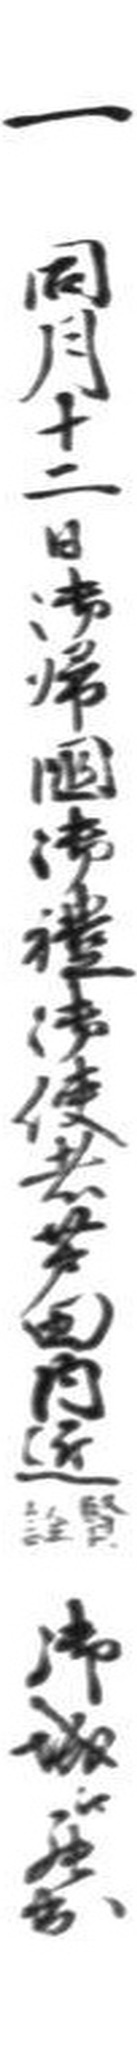一同月十二日御帰国御礼御使者芦田内匠賢詮御城江罷出
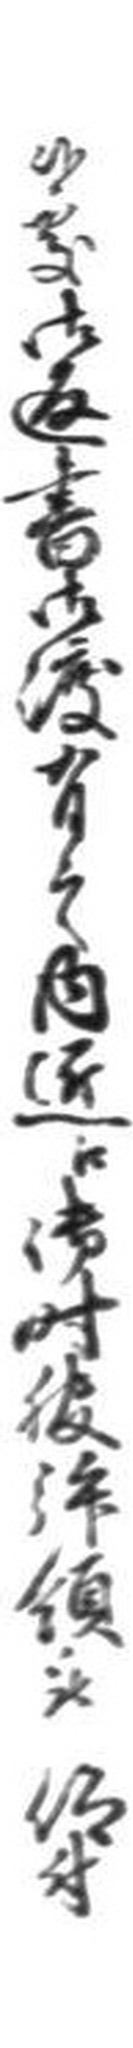候処御返書御渡有之内匠江御時服拝領被仰付
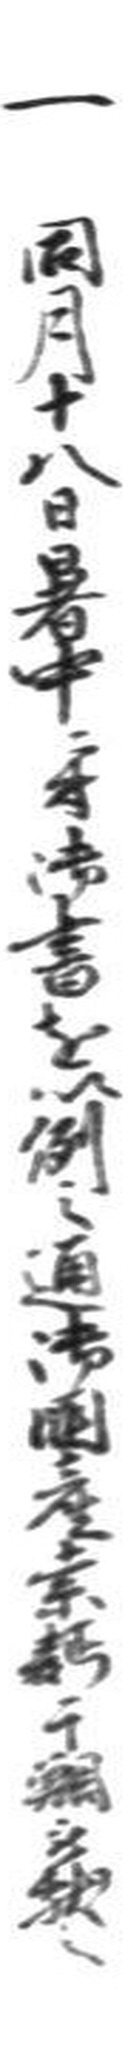一同月十八日暑中ニ付御書を以例之通御国産索麪干鯛被献之
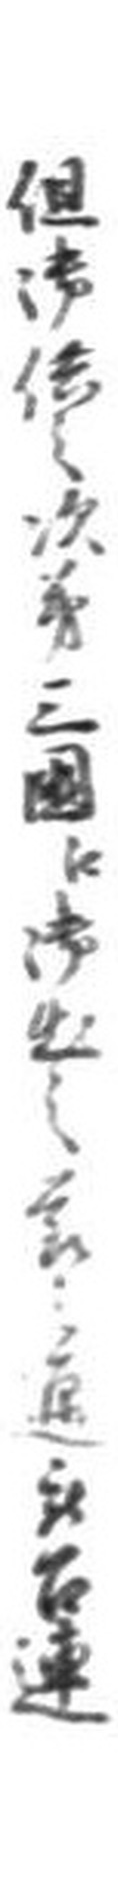但御供之次第三国江御出之節之通被召連
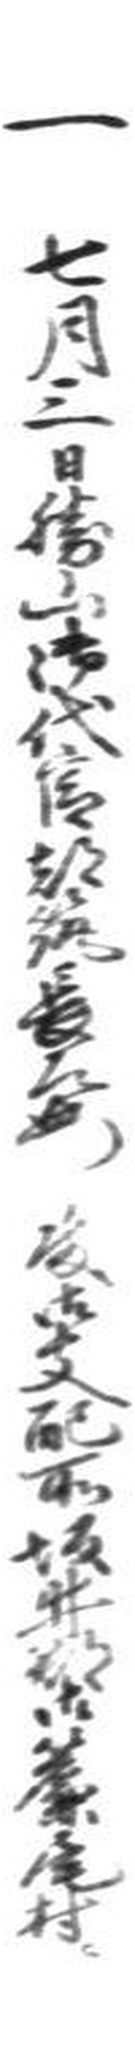一七月三日勝山御代官都筑長左衛門殿御支配所坂井郡御簾尾村ニ
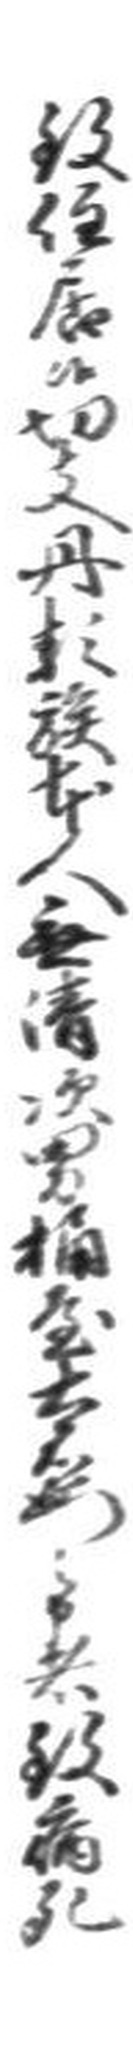致住居候切支丹類族本人無清次男桶屋太右衛門と申者致病死
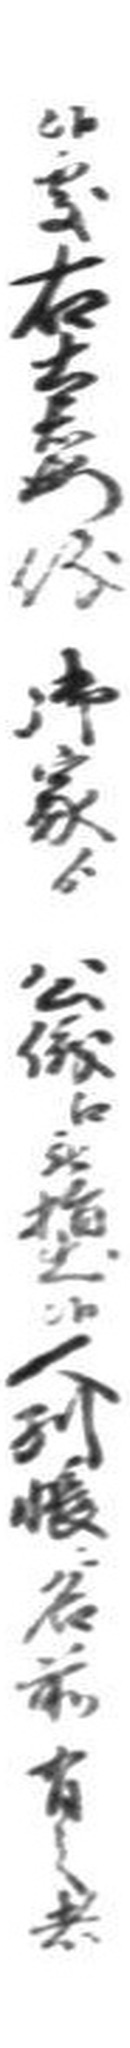候処他太右衛門儀御家ゟ公儀江被指出候人別帳ニ名前有之者

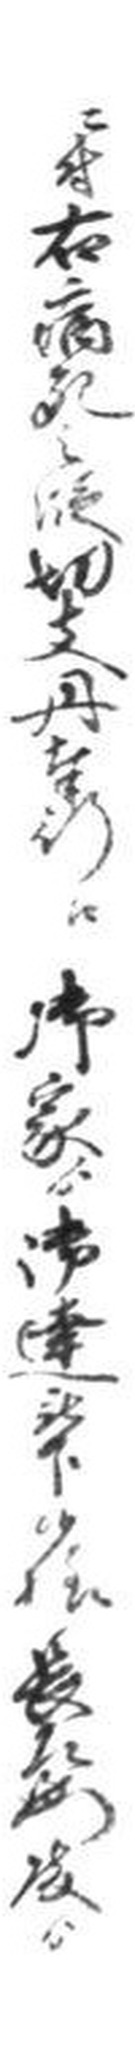ニ付右病死之段切支丹奉行江御家ゟ御達被下候様長左衛門殿ゟ
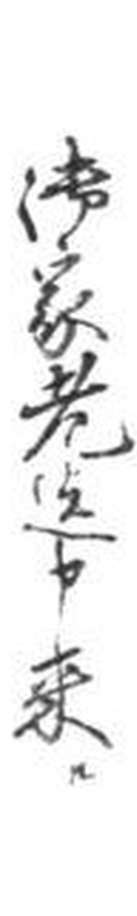御家老迄申来ル
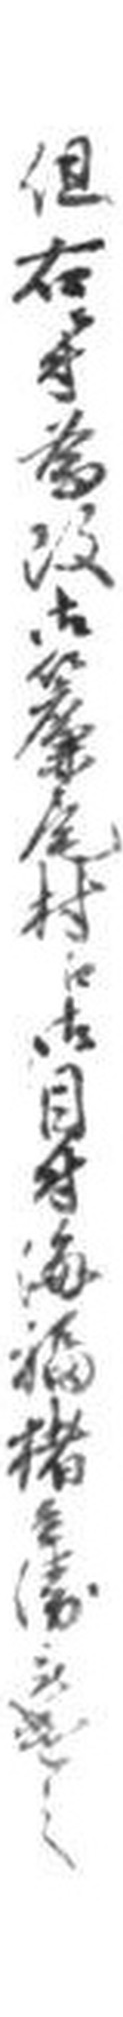但右ニ付為改御簾尾村江御目付海福猪兵衛被遣之
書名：家譜 十七 吉品公 従元禄元年到同二年
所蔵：福井県文書館 Fukui Prefectural Archives
